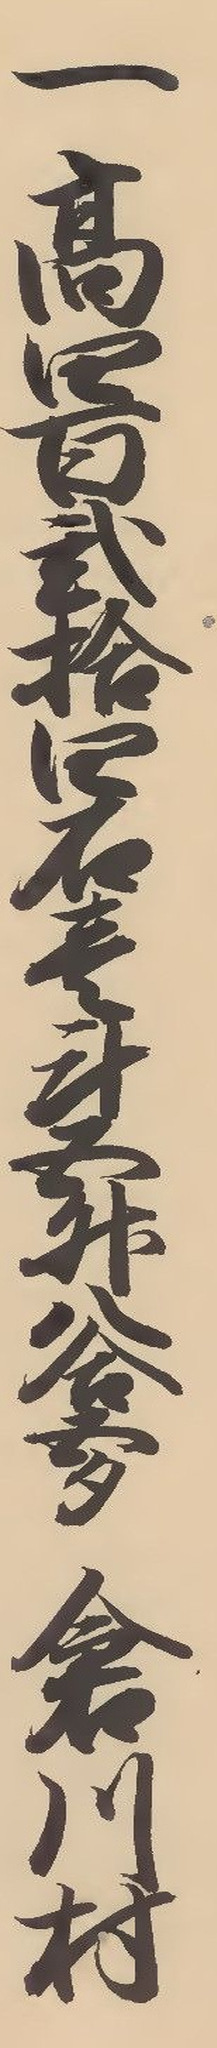一高四百弐拾四石壱斗五升八合五勺倉川村
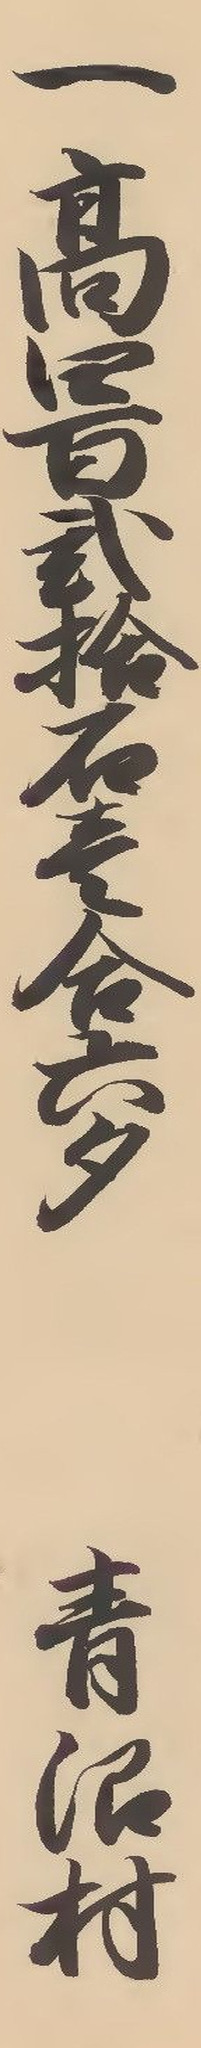一高四百弐拾石壱合六勺青沼村

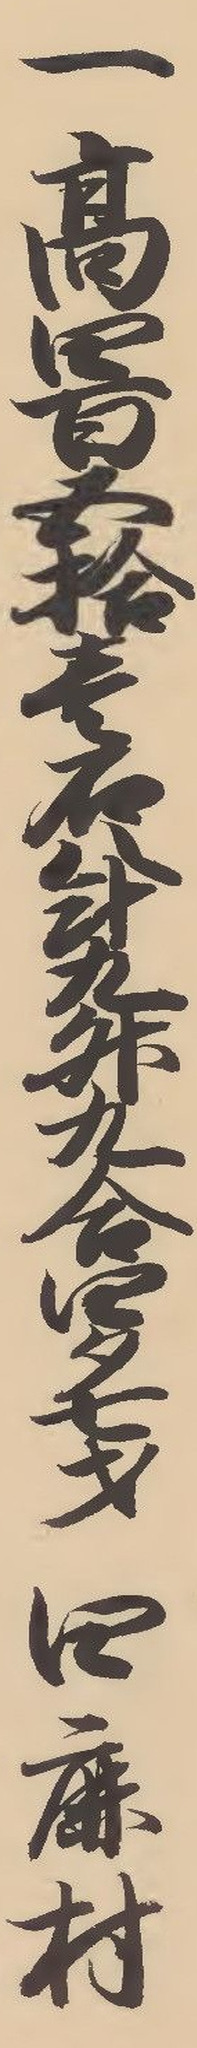一高四百五拾壱石八斗九升九合四勺七才四鹿村
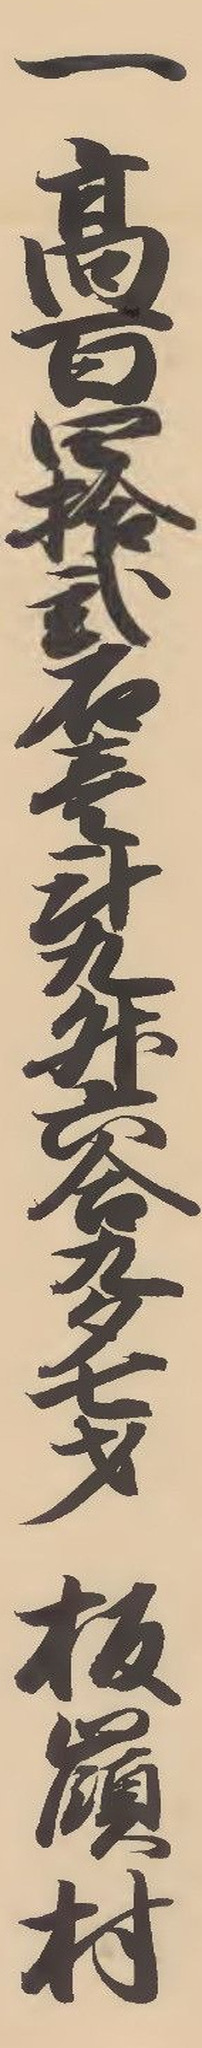一高百四拾弐石壱斗九升六合九勺七才板嶺村
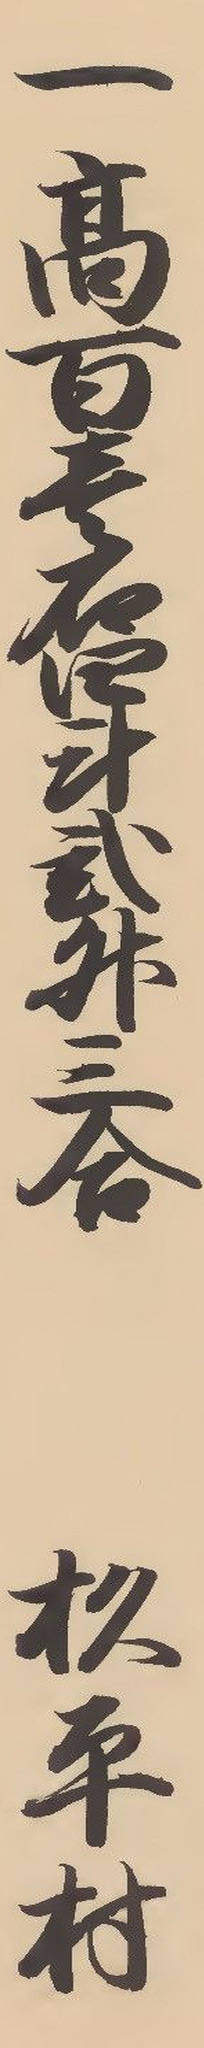一高百壱石四斗弐升三合杉平村
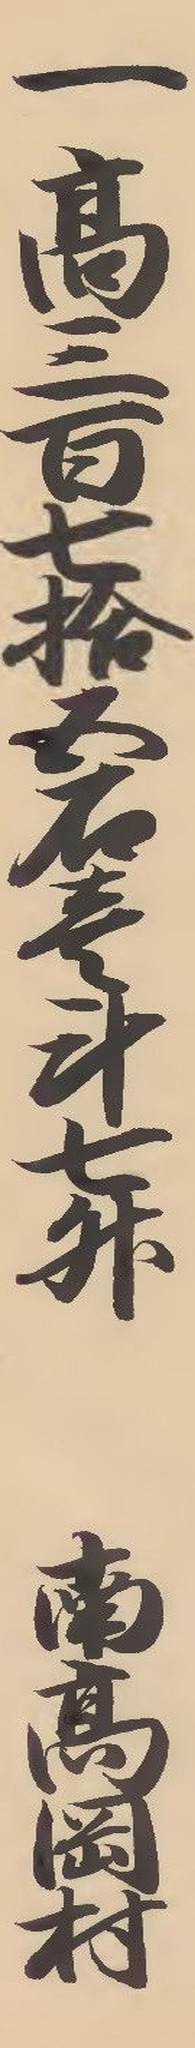一高三百七拾五石壱斗七升南高岡村
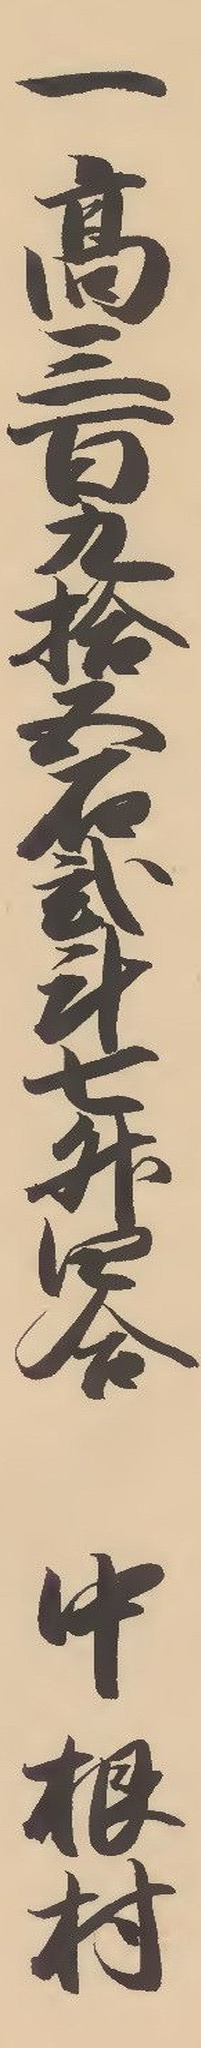一高三百九拾五石弐斗七升四合中根村
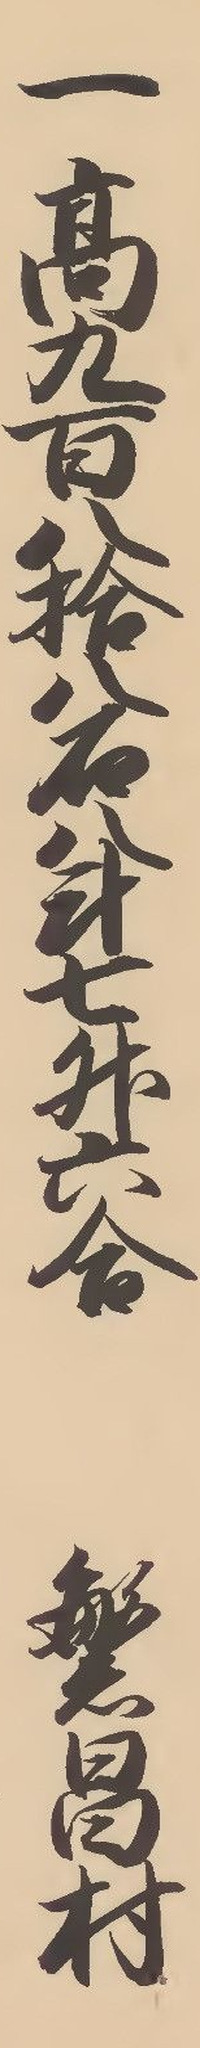一高九百八拾八石八斗七升六合繁昌村
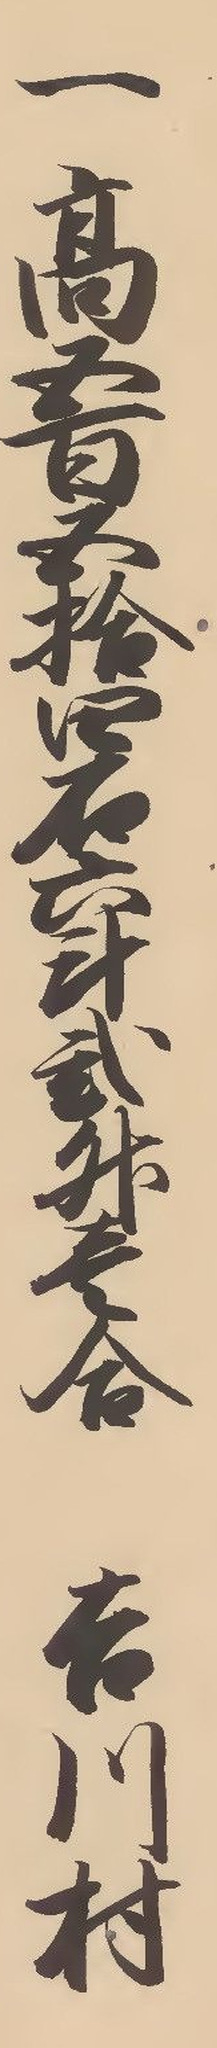一高五百五拾四石六斗弐升壱合吉川村
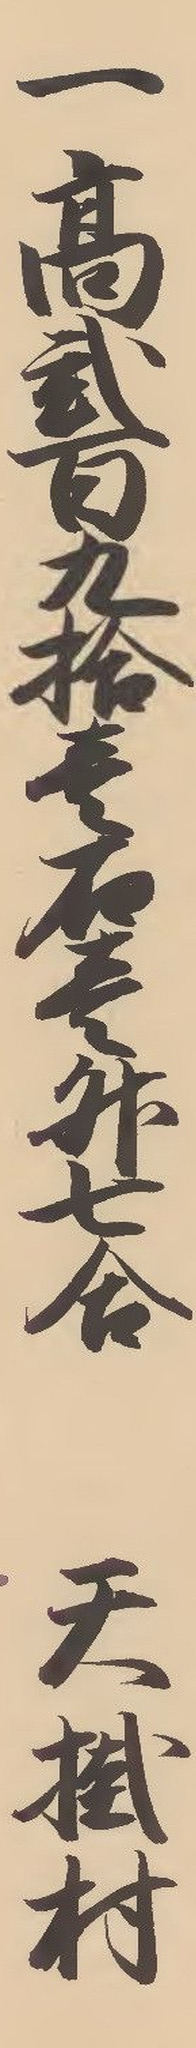一高弐百九拾壱石壱升七合天掛村

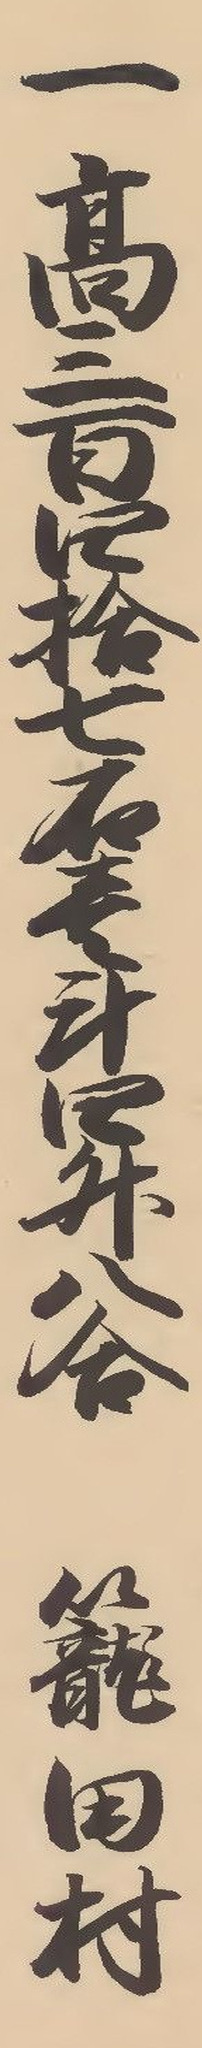一高三百四拾七石壱斗四升八合篭田村
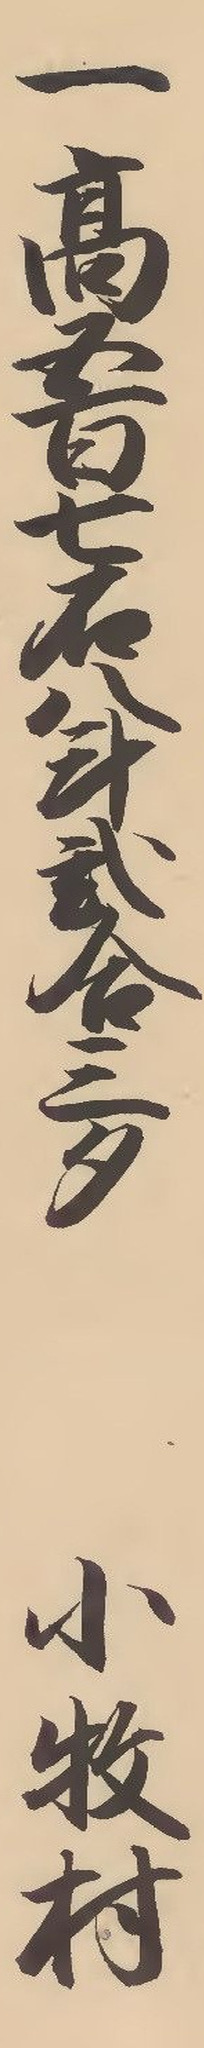一高五百七石八斗弐合三勺小牧村
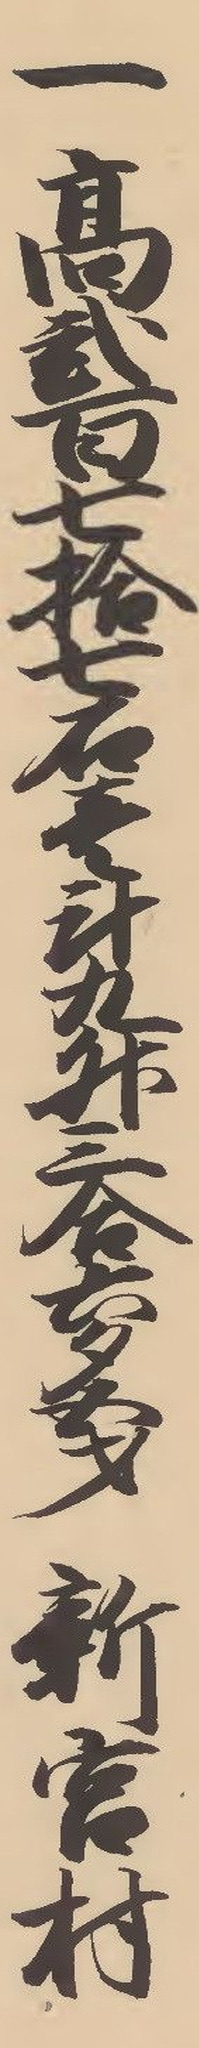一高弐百七拾七石壱斗九升三合六勺五才新宮村
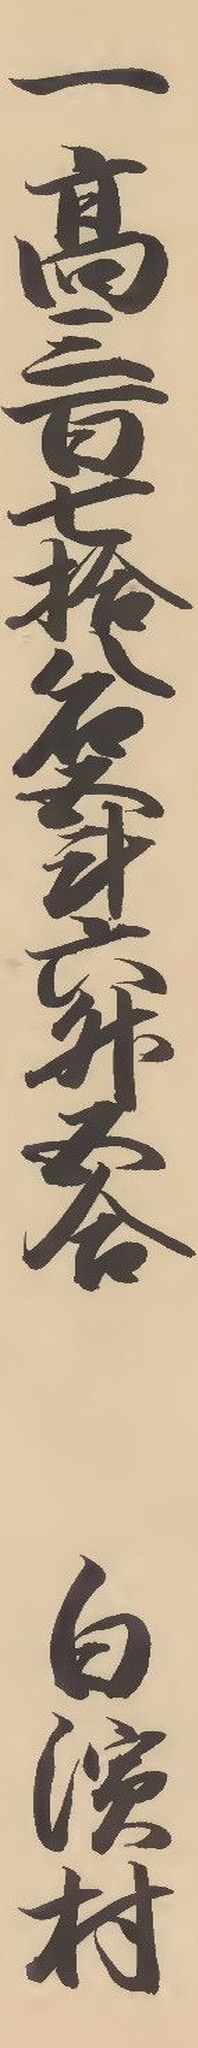一高三百七拾八石五斗六升五合白浜村
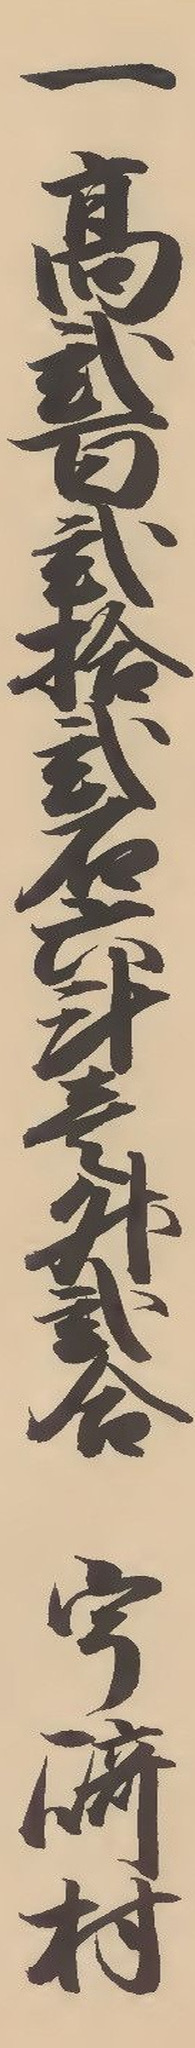一高弐百弐拾弐石六斗壱升弐合宇崎村
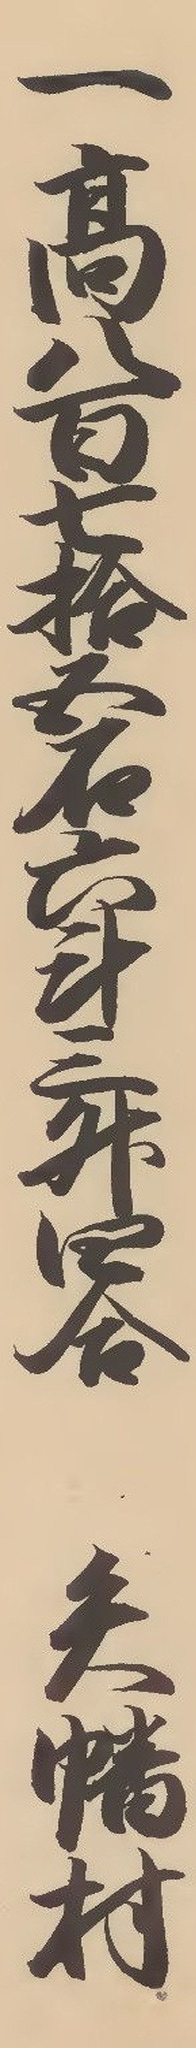一高八百七拾五石六斗三升四合矢幡村
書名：常陸国郷帳
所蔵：国立公文書館 National Archives of Japan
